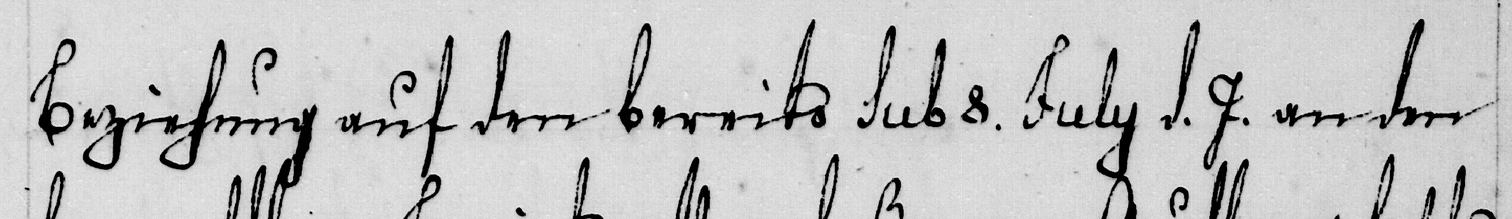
Beziehung auf den bereits sub 8. July d. J. an den
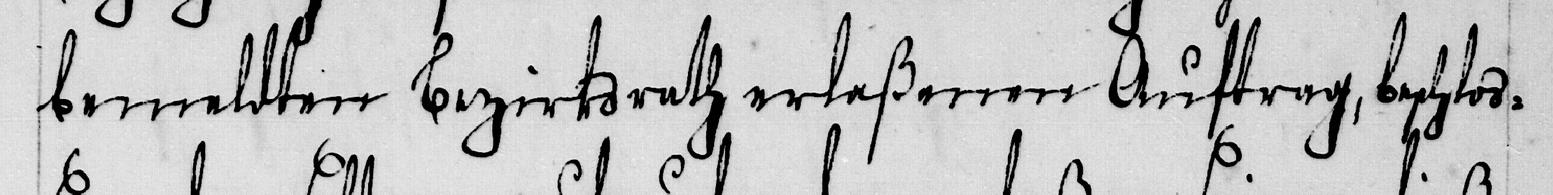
bemeldten Bezirksrath erlaßenen Auftrag, beschlo¬
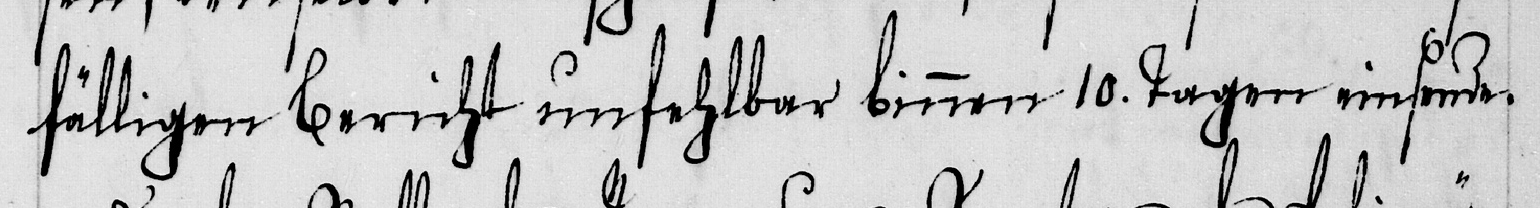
fälligen Bericht unfehlbar binnen 10. Tagen einsende.
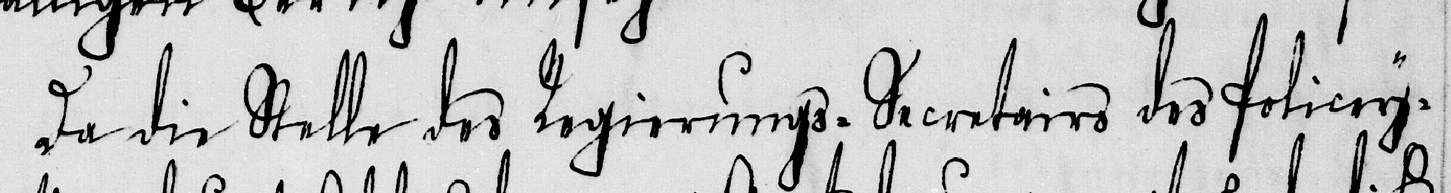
Da die Stelle des Regierungs-Secretairs des Policey¬
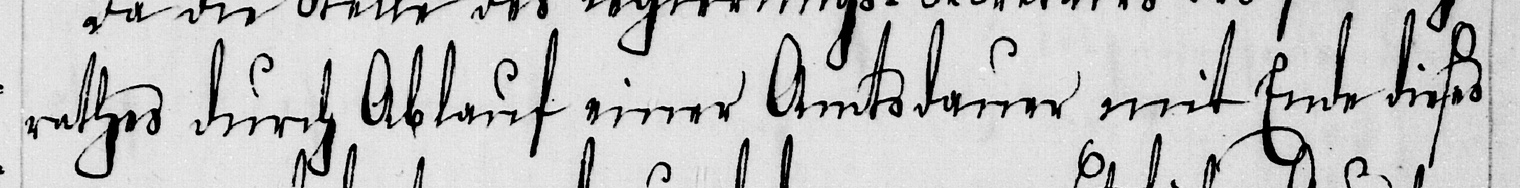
rathes durch Ablauf einer Amtsdauer mit Ende dieses
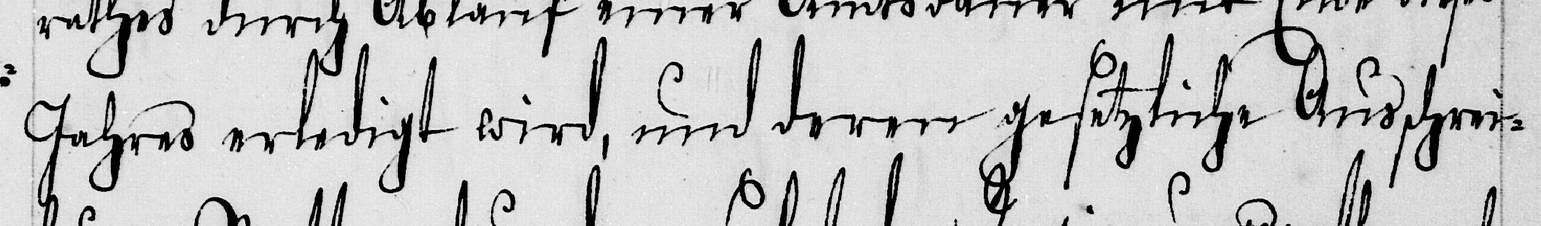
Jahres erledigt wird, und deren gesetzliche Ausschre¬
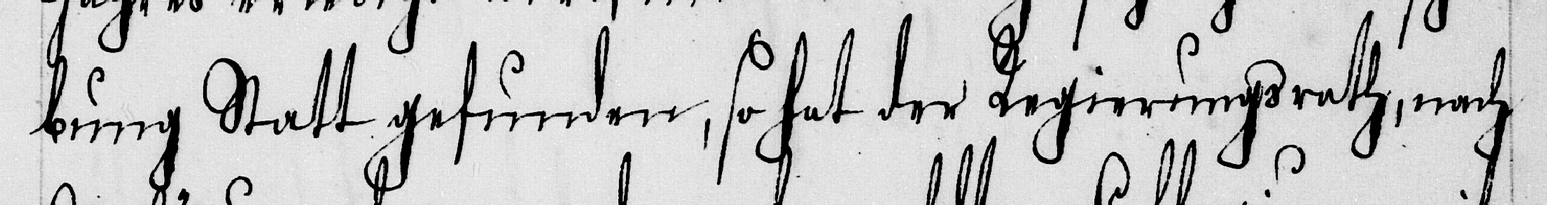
ibung Statt gefunden, so hat der Regierungsrath, nach
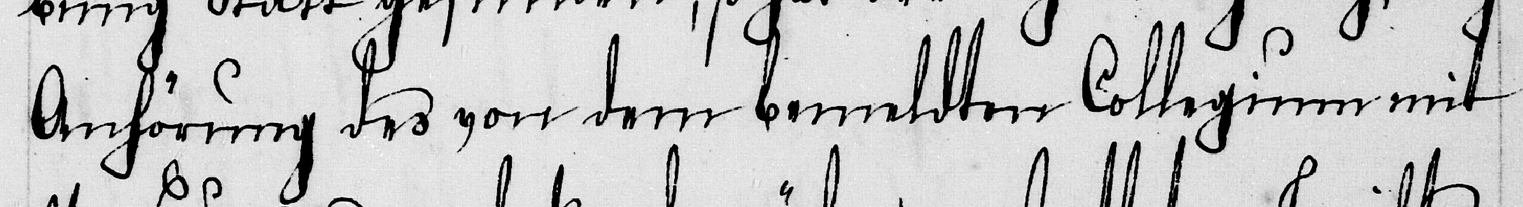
Anhörung des von dem bemeldten Collegium mit
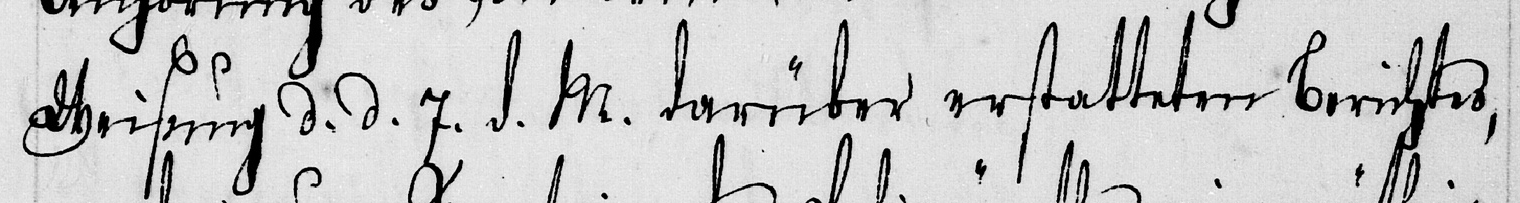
Weisung d. d. 7. d. M. darüber erstatteten Berichtes,
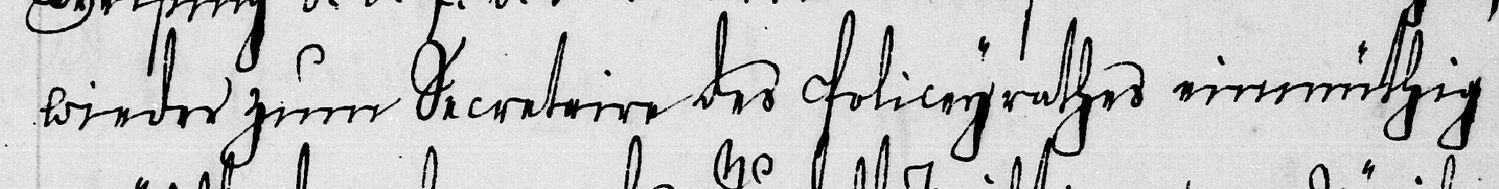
wieder zum Secretaire des Policeyrathes einmüthig
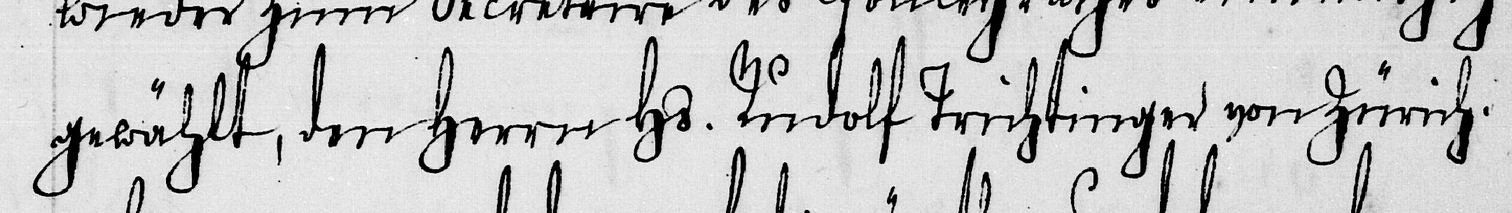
gewählt, den Herrn Hs. Rudolf Trichtinger von Zürich.
